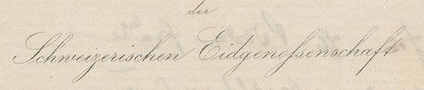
Schweizerischen Eidgenossenschaft
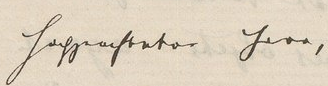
Hochgeachteter Herr,
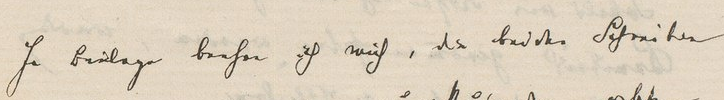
In Beilage beehre ich mich, die beiden Schreiben
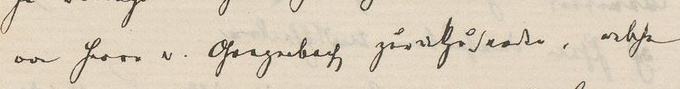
von Herrn v. Gonzenbach, zurückzusenden, welche
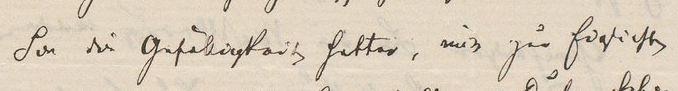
Sie die Gefälligkeit hatten, mir zur Einsicht
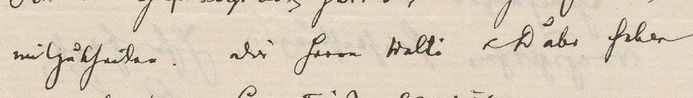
mitzutheilen. Die Herrn Welti & Dubs haben
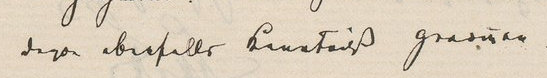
davon ebenfalls Kenntniß genommen.
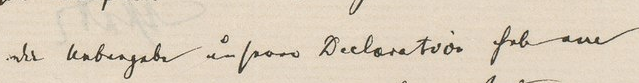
Die Uebergabe unserer Declaration hat am
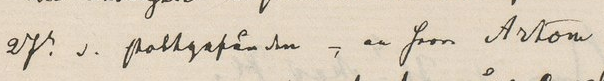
27t d. stattgefunden –, an Herrn Artom,
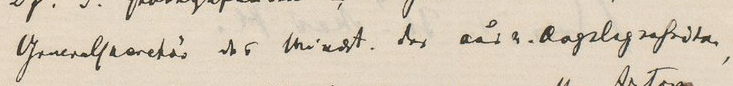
Generalsecretär des Minist. der ausw. Angelegenheiten,
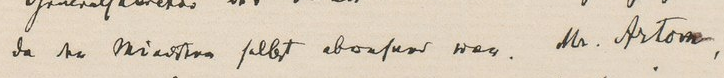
da der Minister selbst abwesend war. Mr. Artom,
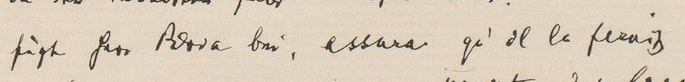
fügte Herr Pioda bei, assura qu'il la ferait
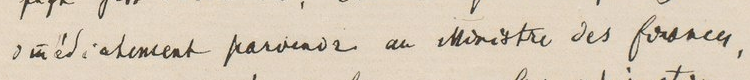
immédiatement parvenir au Ministre des finances,
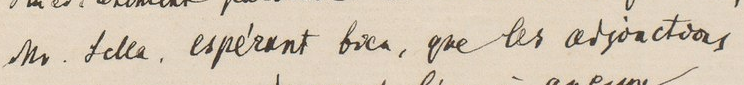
Mr. Sella, espérant bien, que les adjonctions
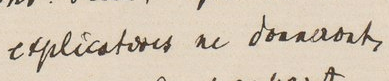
explicatives ne donneront
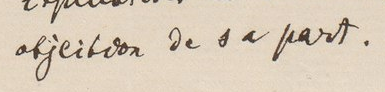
objection de sa part.
